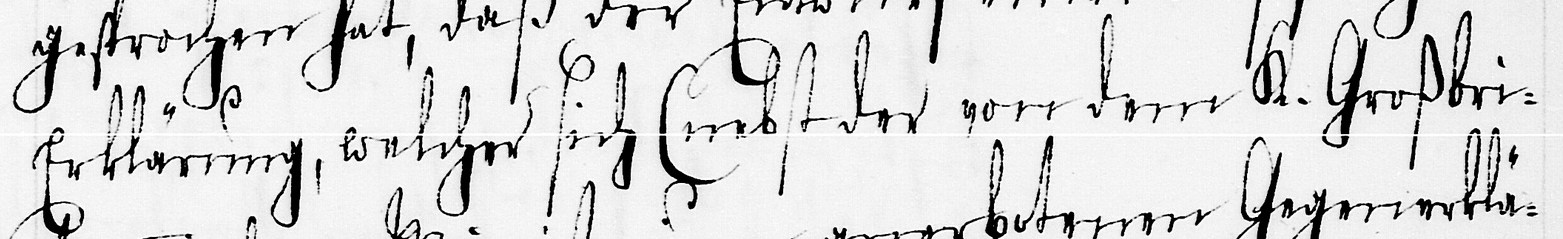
Erklärung, welcher sich (nebst der von dem K. Großbri¬
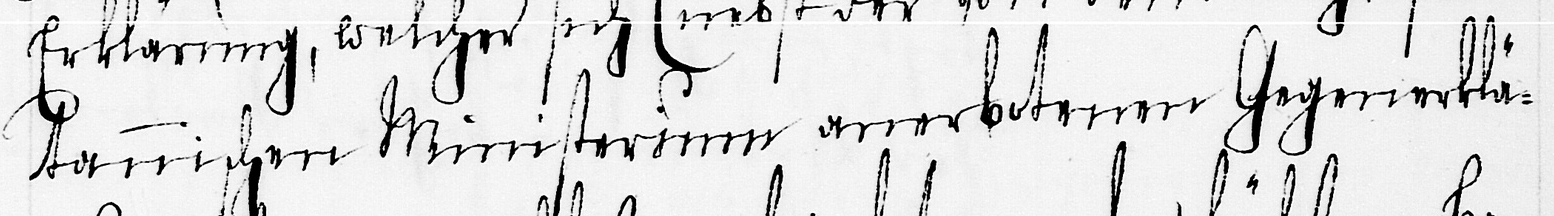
tannischen Ministerium anerbotenen Gegenerklä¬
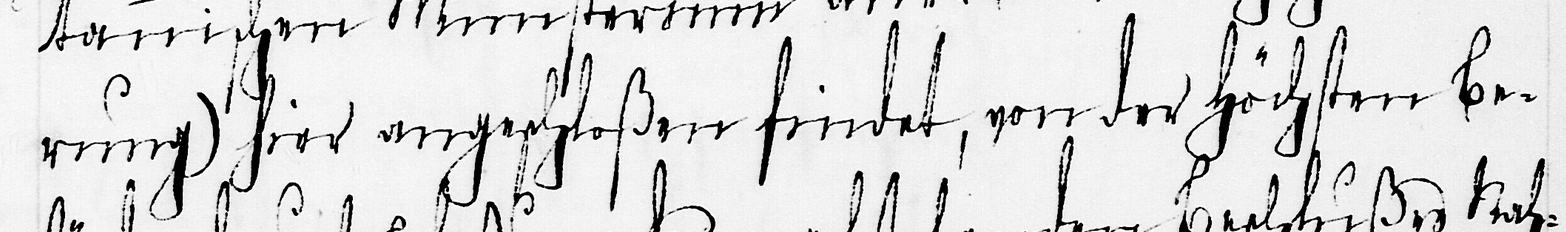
rung) hier angeschloßen findet, von der Höchsten Be¬
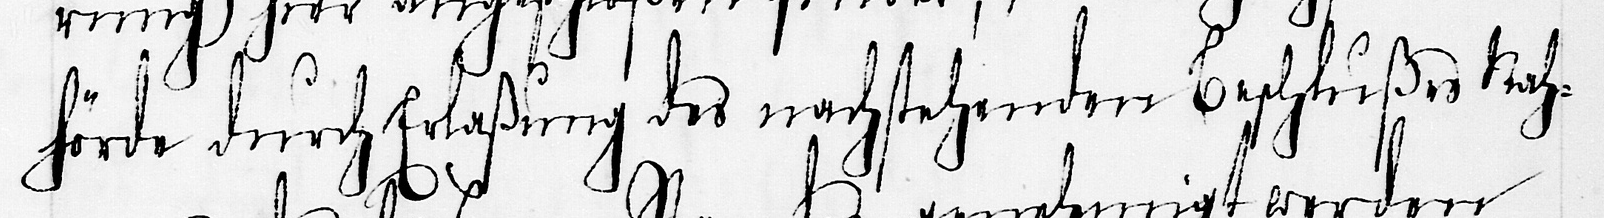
hörde durch Erlaßung des nachstehenden Beschlußes Nah¬
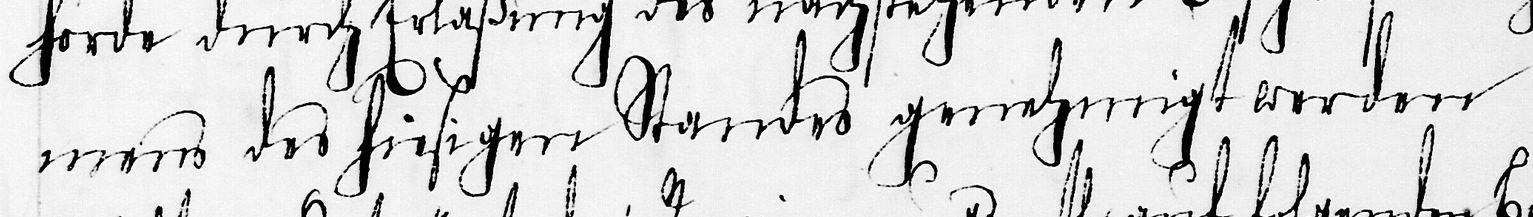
mens des hiesigen Standes genehmigt werden
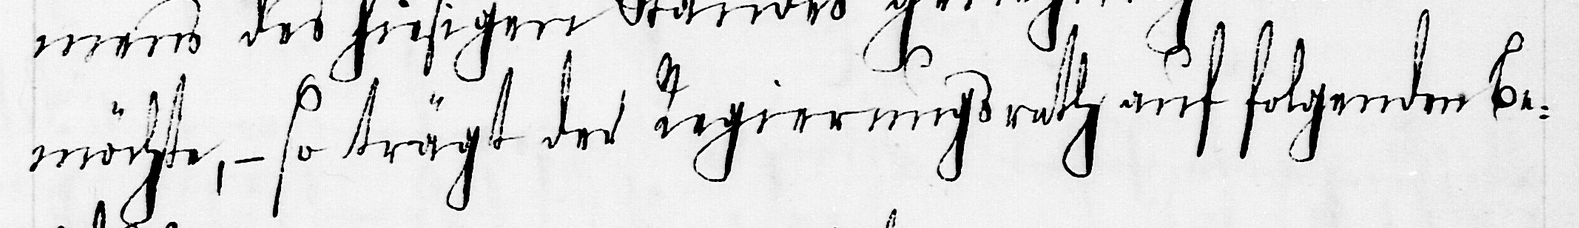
möchte, – so trägt der Regierungsrath auf folgenden Be¬
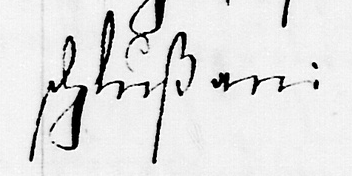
schluß an:
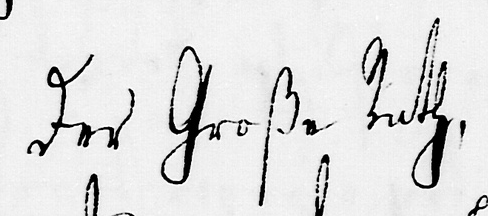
Der Große Rath,
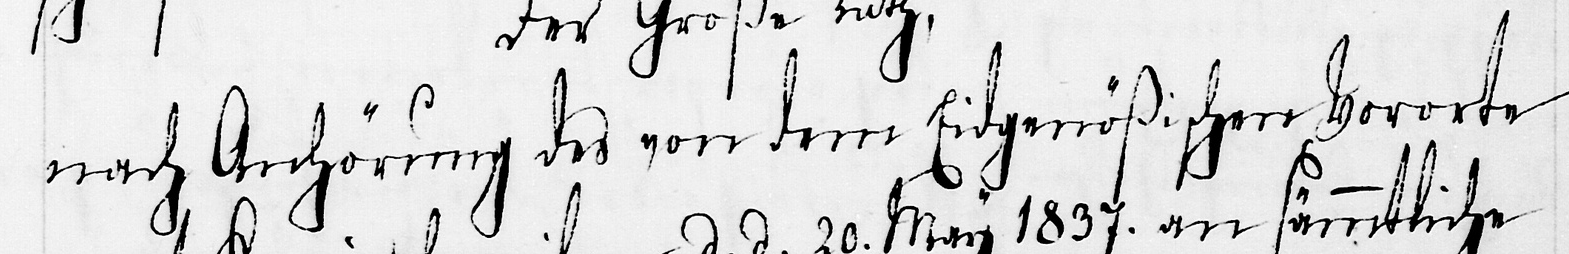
nach Anhörung des von dem Eidgenößischen Vororte
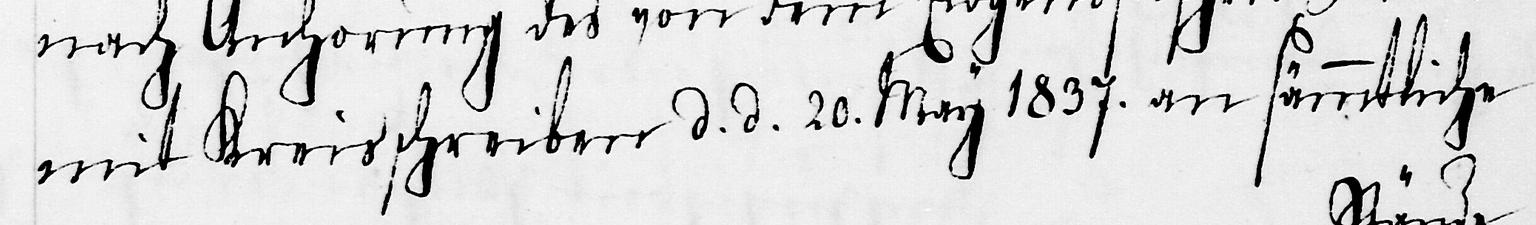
mit Kreisschreiben d. d. 20. März 1837. an sämmtliche
